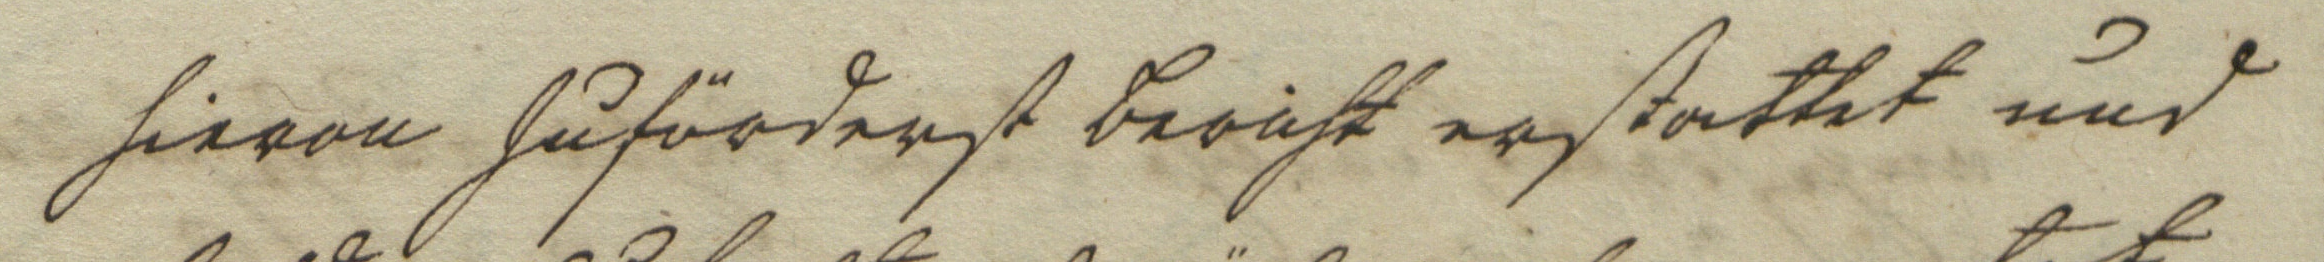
hievon zuförderst Bericht erstattet und
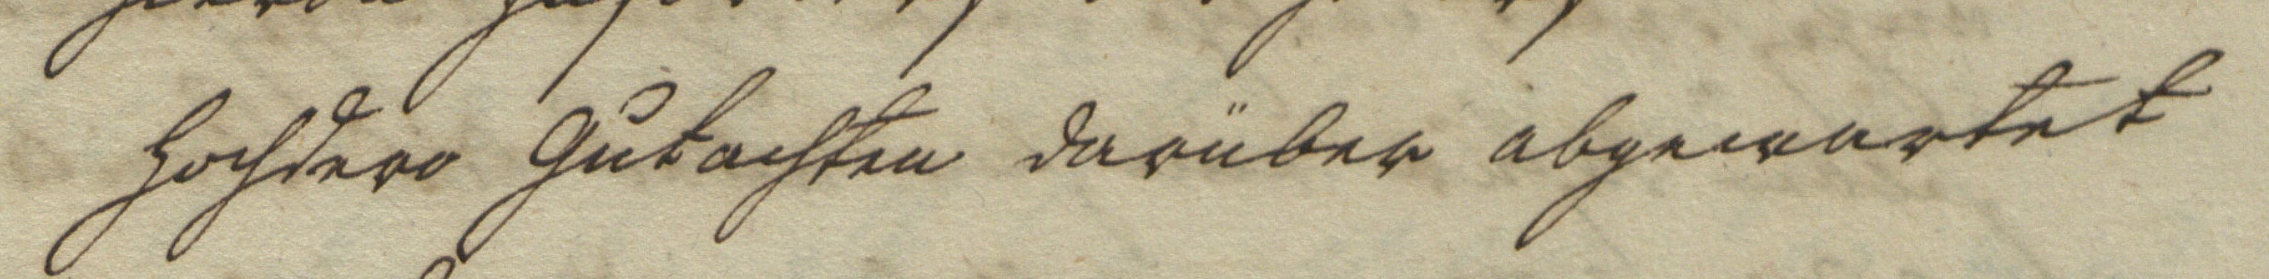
hochdero Gutachten darüber abgewartet
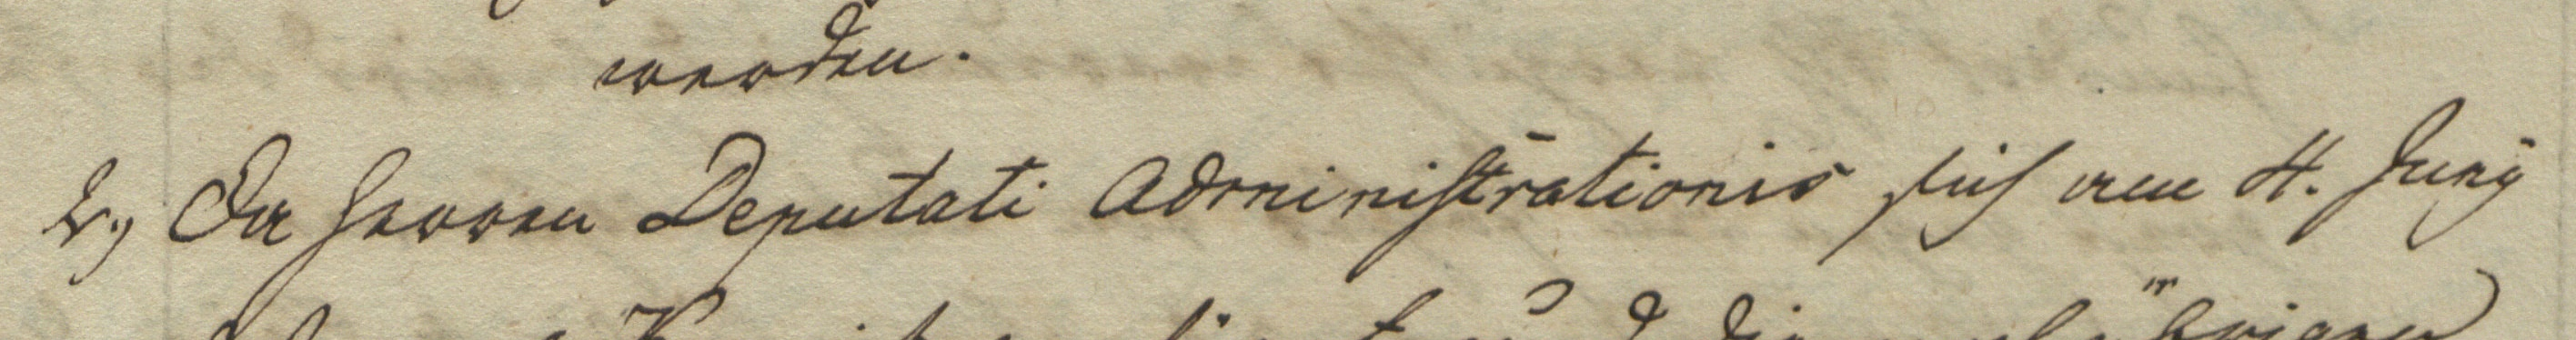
2., Da Herren Deputati Administrationis sich am 4. Juny
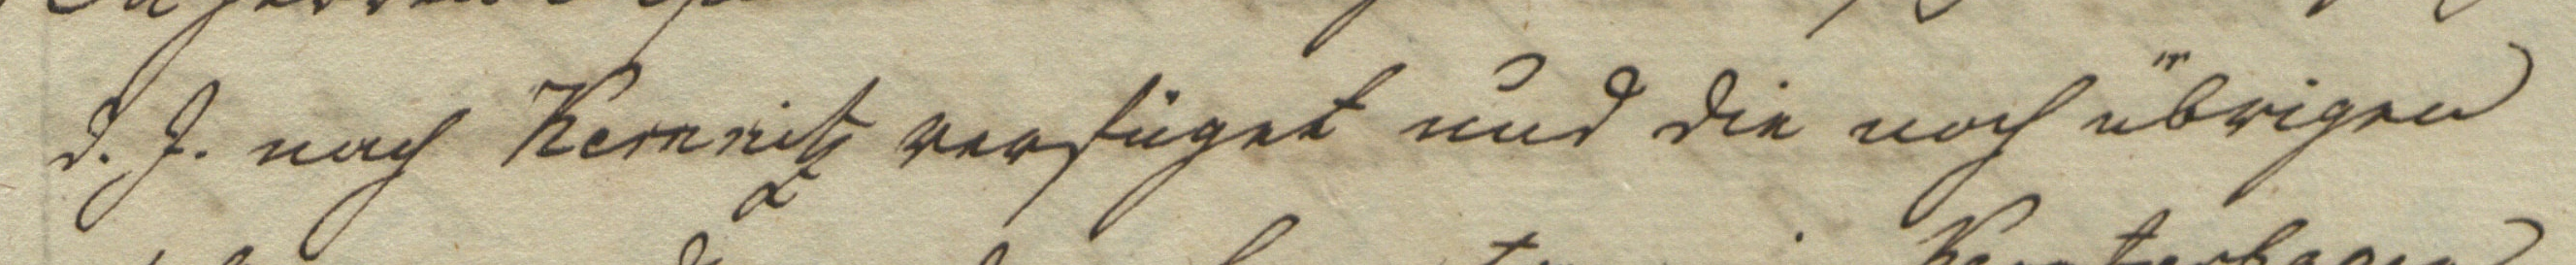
d. J. nach Kemnitz verfüget und die noch übrigen
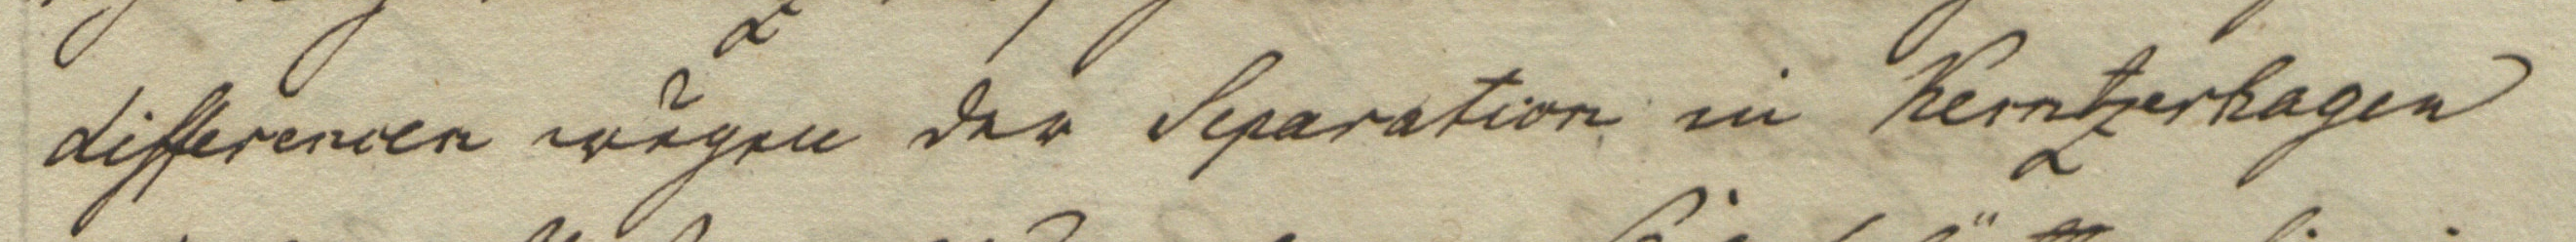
Differencen wegen der Separation in Kemtzerhagen
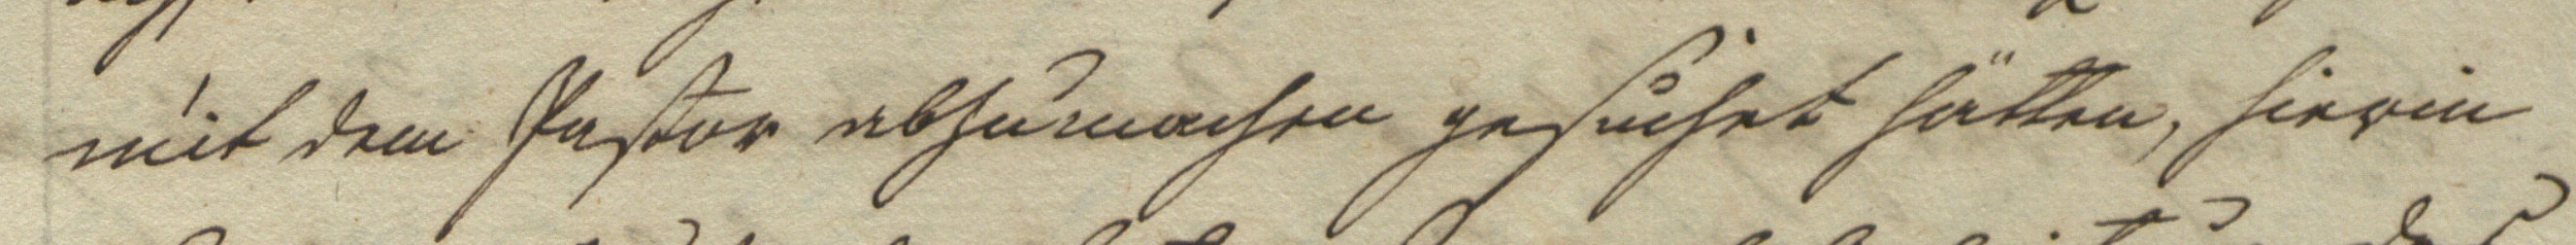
mit dem Pastor abzumachen gesuchet hätten, hierin
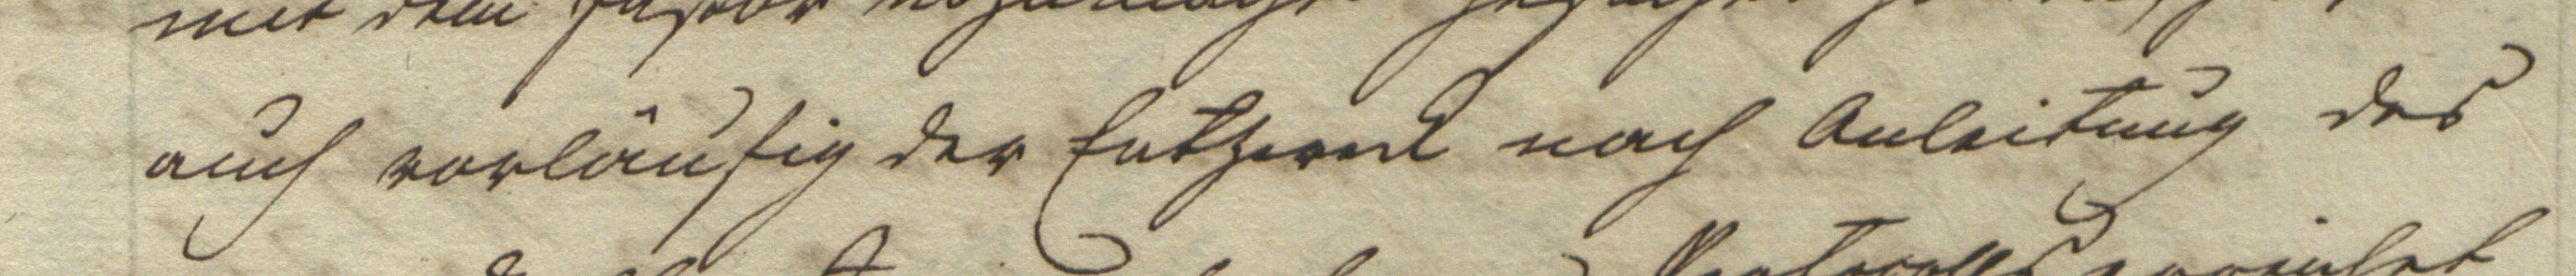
auch vorläufig der Entzweck nach Anleitung des
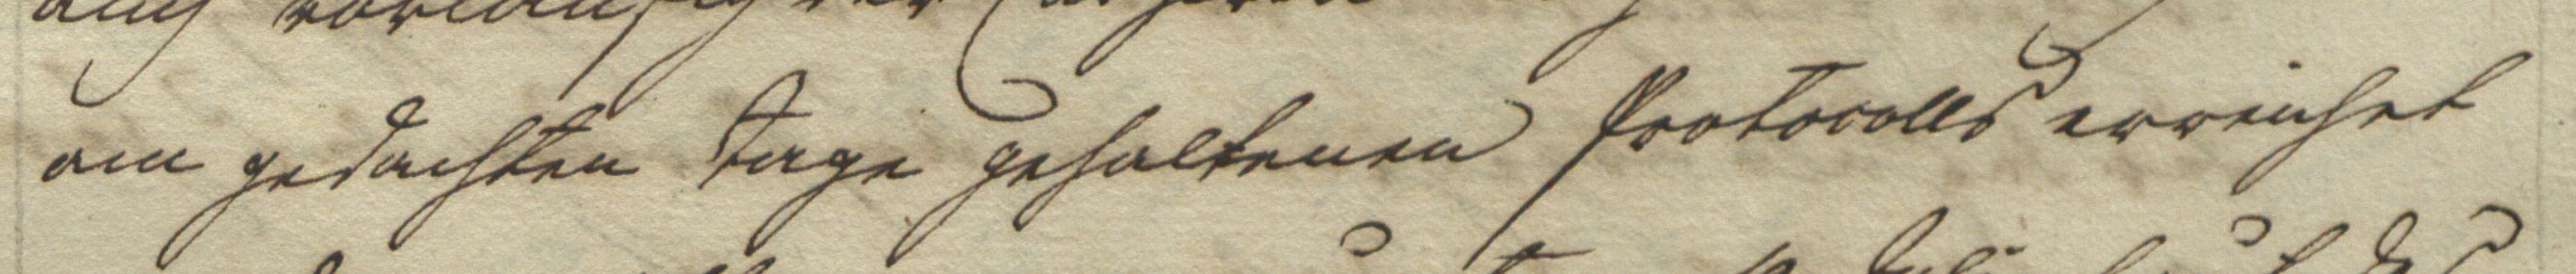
am gedachten Tage gehaltenen Protocolls erreichet
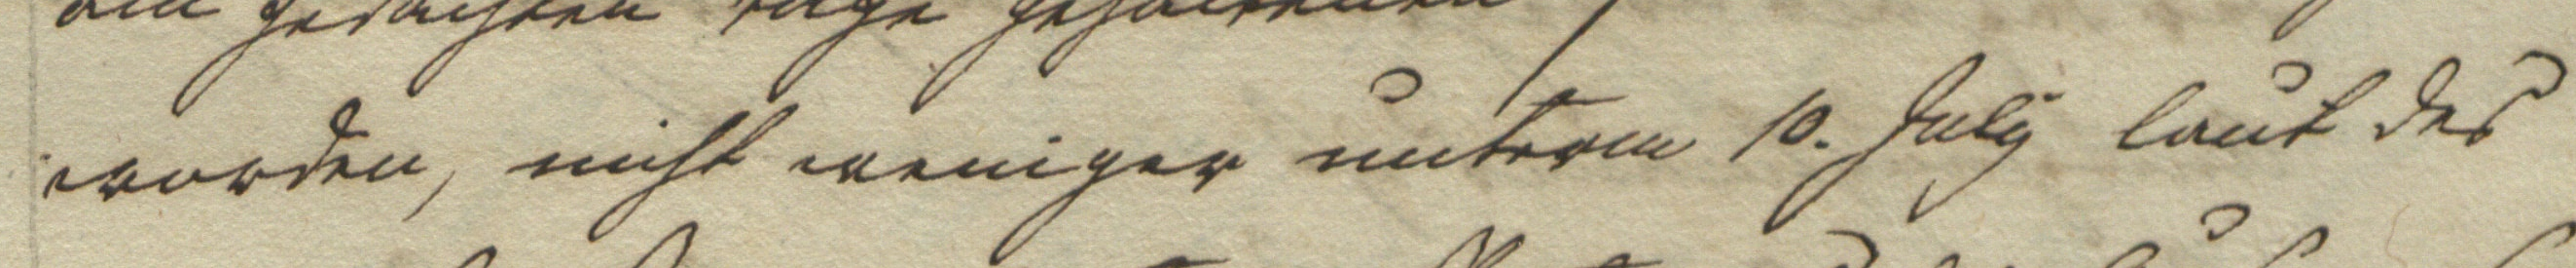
worden, nicht weniger unterm 10. July laut des
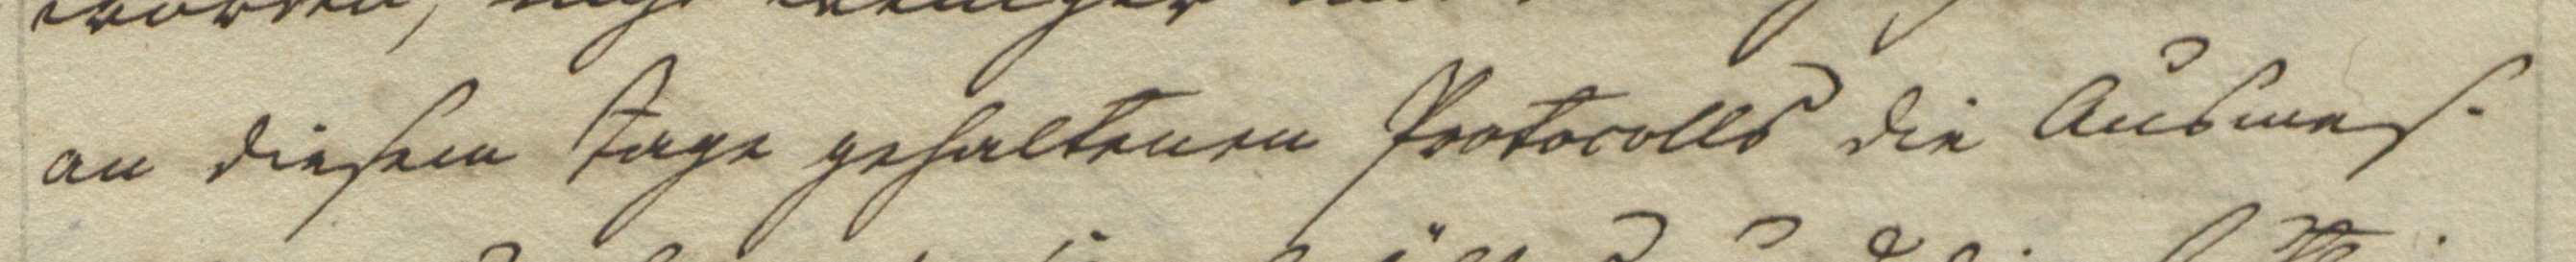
an diesem Tage gehaltenen Protocolls die Ausmes¬
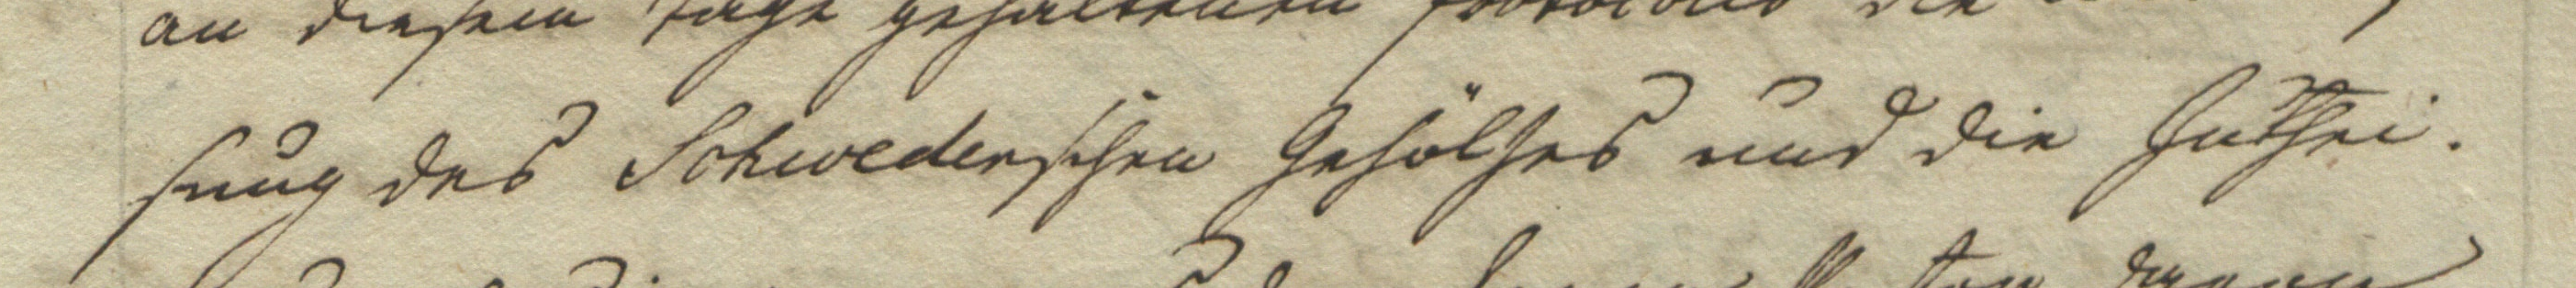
sung des Schwederschen Gehöftes und die Zuthei¬
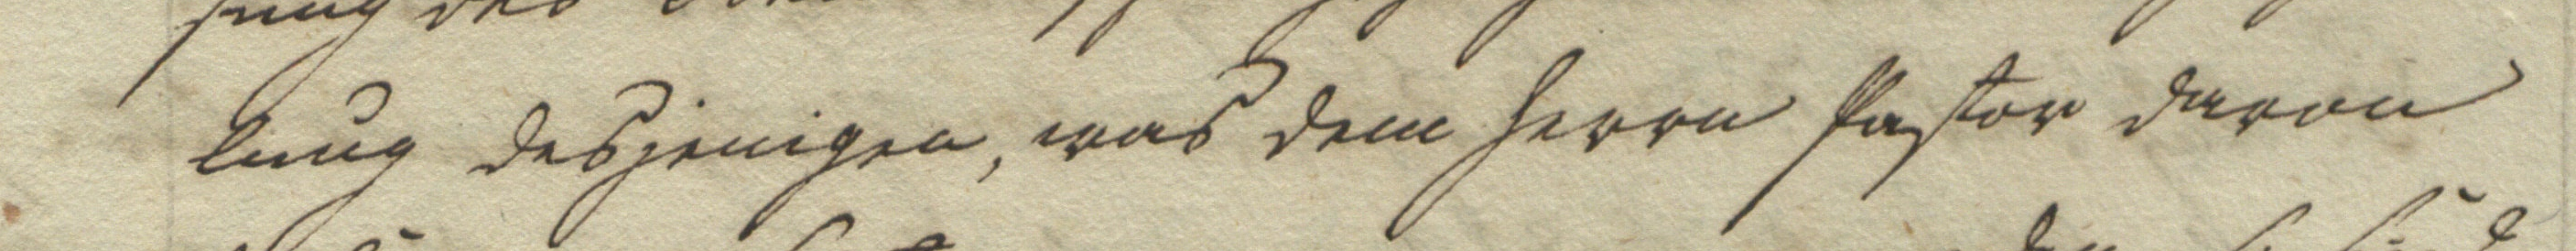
lung desjenigen, was dem Herrn Pastor davon
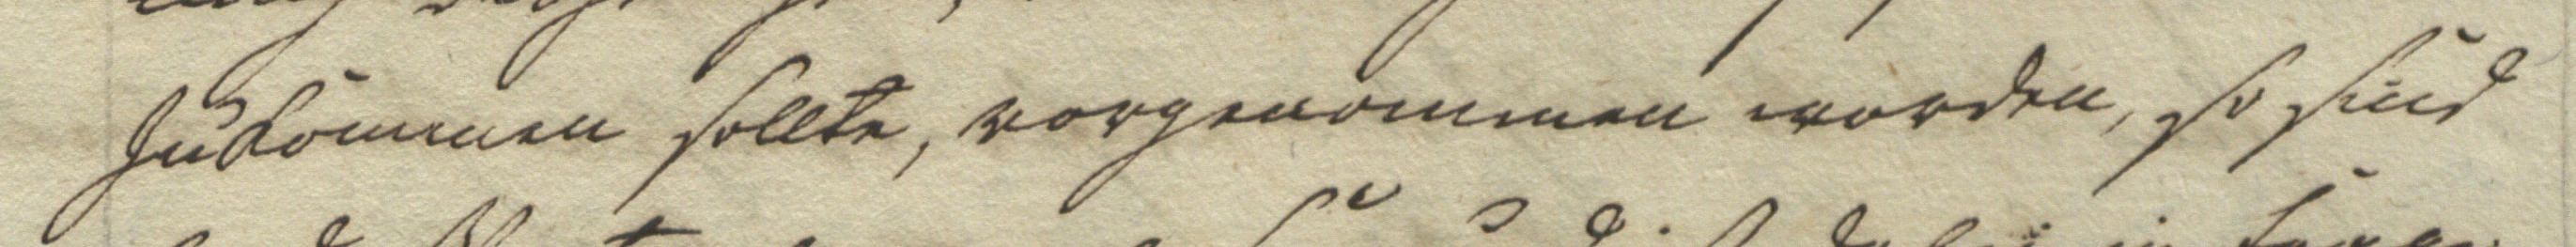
zukommen sollte, vorgenommen worden, so sind
